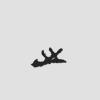出
